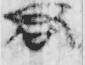君
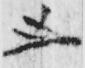之
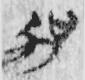加
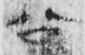公
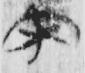宋
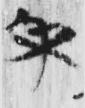年
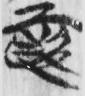婁
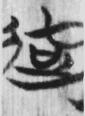适
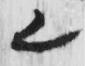乙
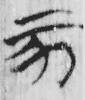亥
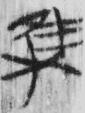集
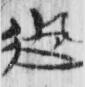○（卜）
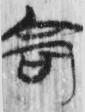命
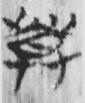登
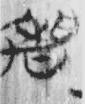嘉
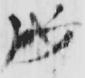戊
